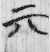亓（其）
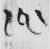州
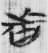者
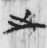之
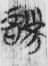○（察）
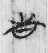告
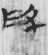阩
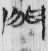門
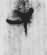又（有）
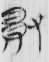敗
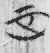正
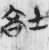塙
